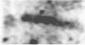一
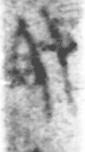○（畋）
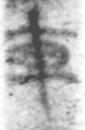車
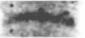一
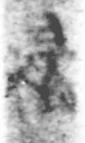椯
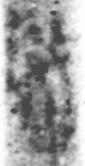轂
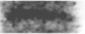一
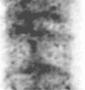王
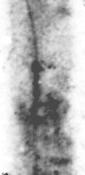僮
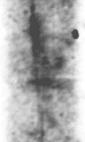車
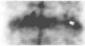一
